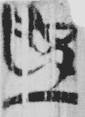聖（聽）
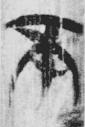不
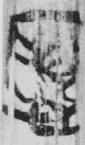聰
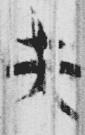○（堯）
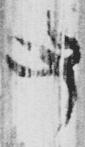又（有）
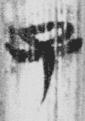子
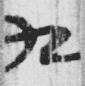九
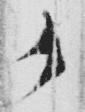人
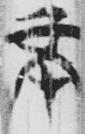不
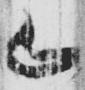㠯（以）
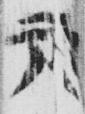亓（其）
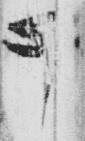子
